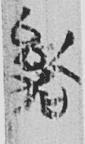幼
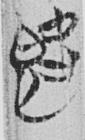既
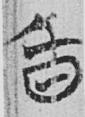昏（聞）
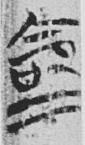命
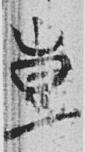壴（矣）
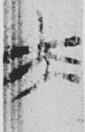夫
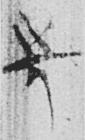先
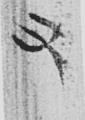又（有）
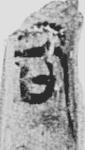司
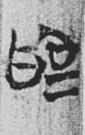爲
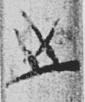之
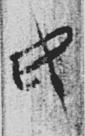女（如）
